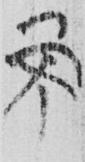不
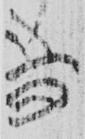○（時）
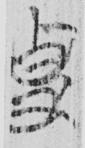○（使）
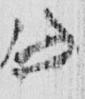公
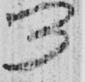乃
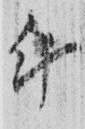身
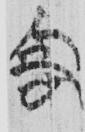命
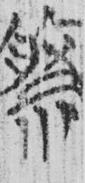祭
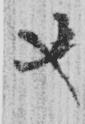又（有）
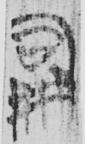○（司）
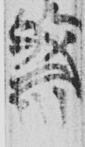祭
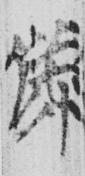備（服）
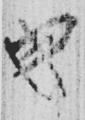母（無）
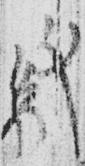○（黼）
